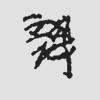歆
